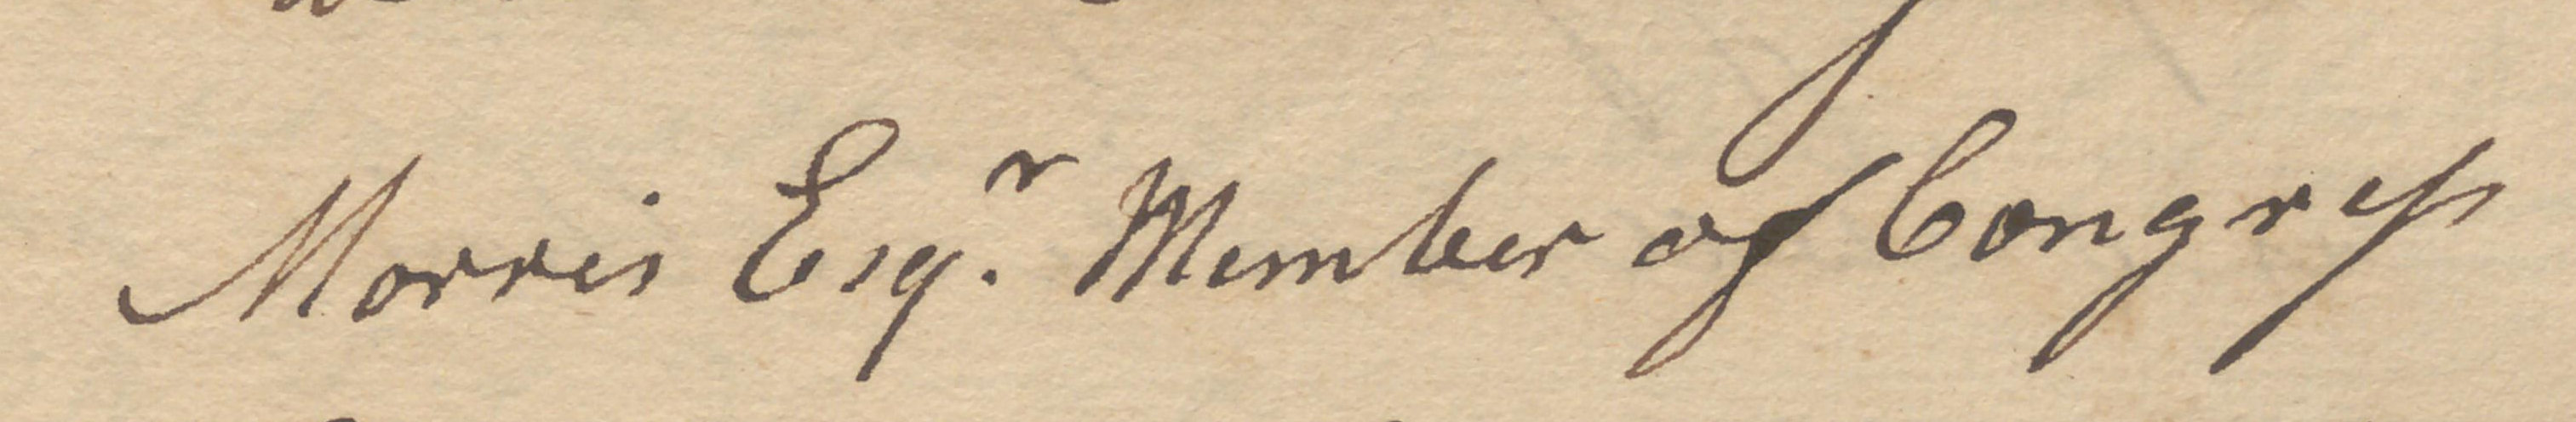Morris Esq^r. Member of Congress
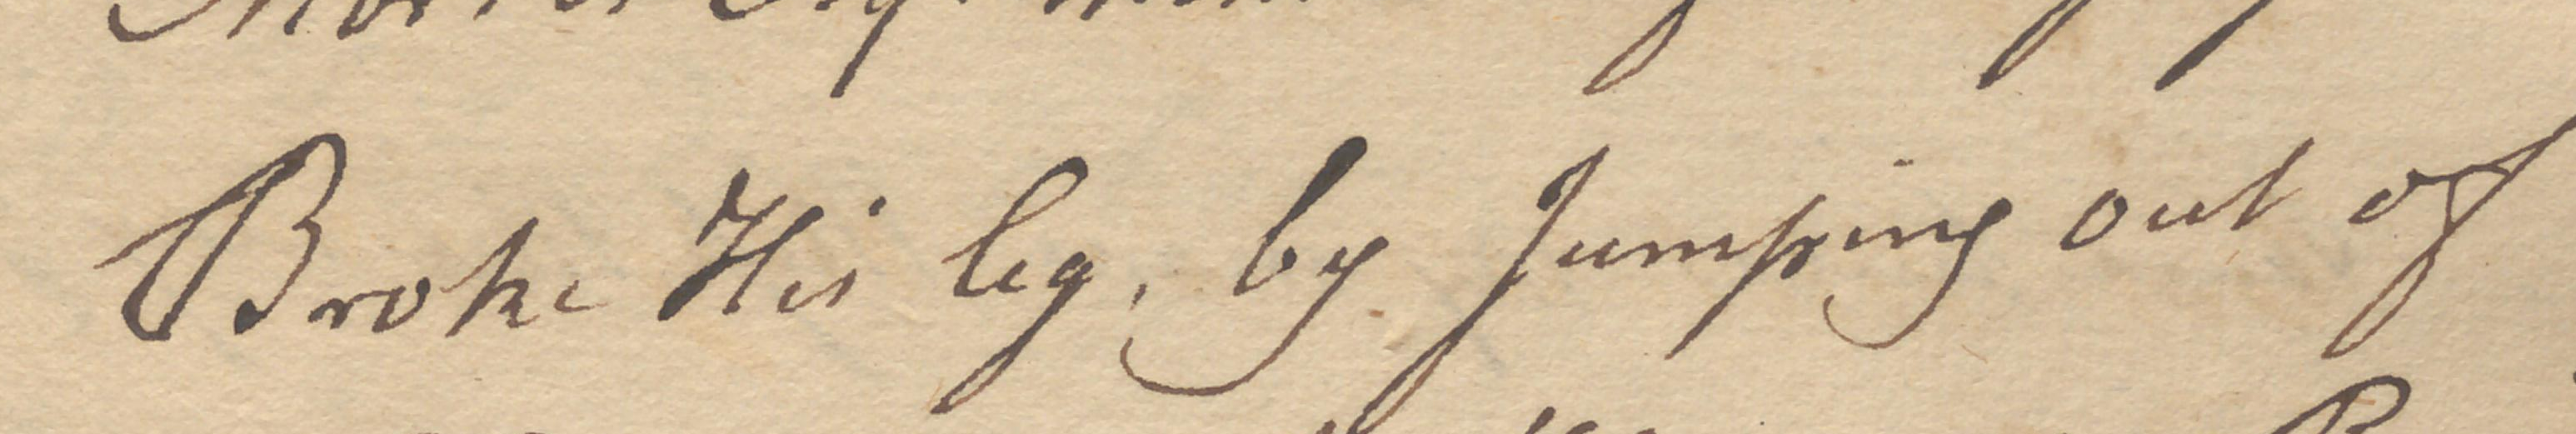Broke His leg, by Jumping out of
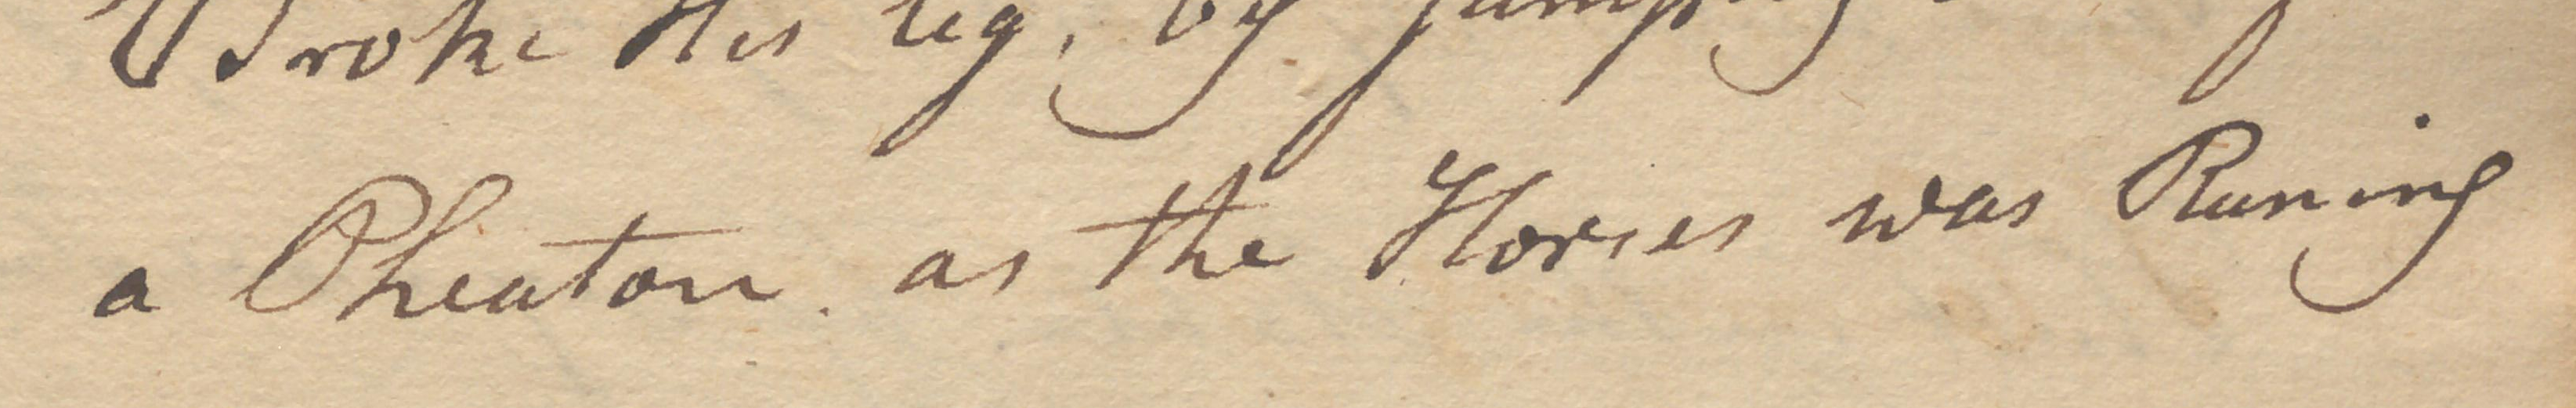a Pheaton as the Horses was Runing
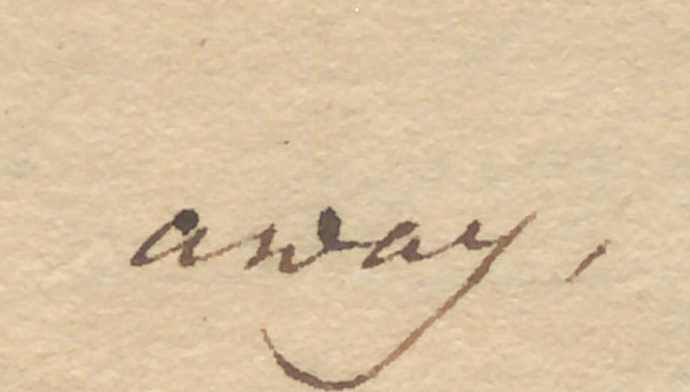away,
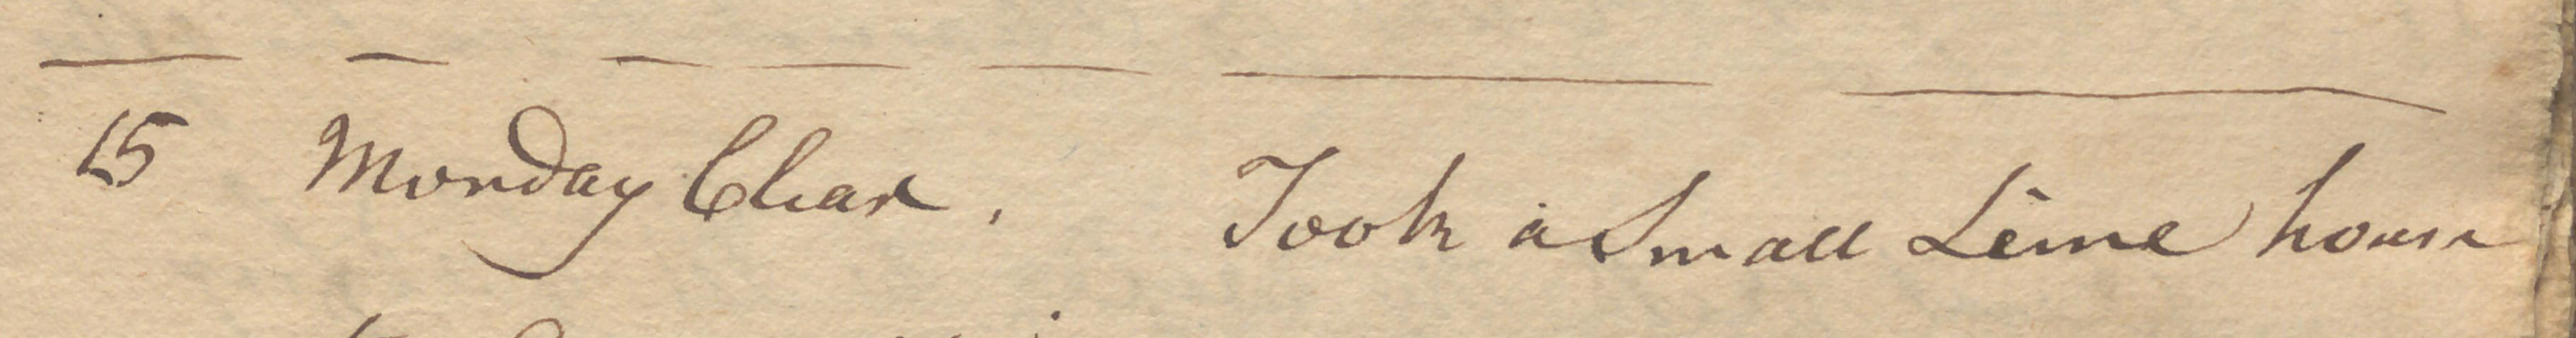15 Monday Clear. Took a small Lime house
